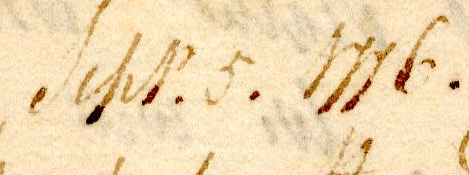Sept^r. 5. 1776.
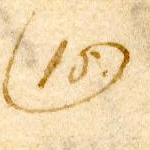15
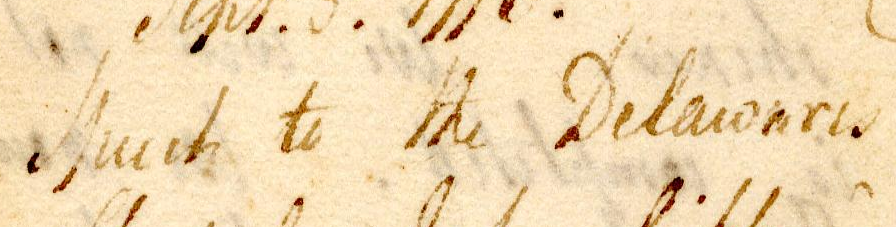Speech to the Delawares
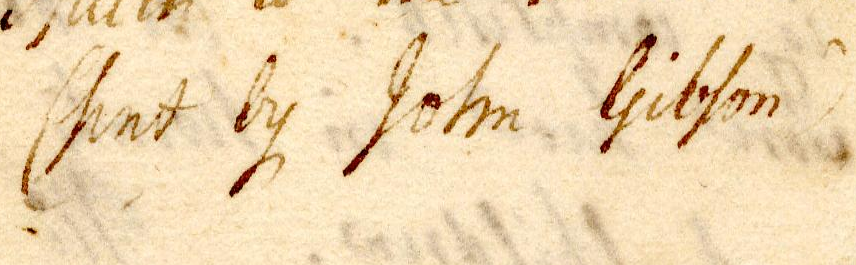Sent by John Gibson
